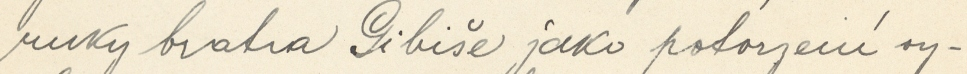ruky bratra Sibiše jako potvrzení vy-
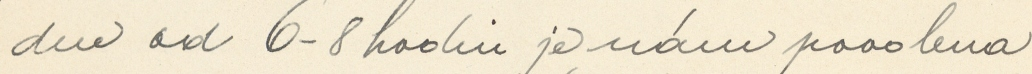dne od 6-8 hodin je nám povolena
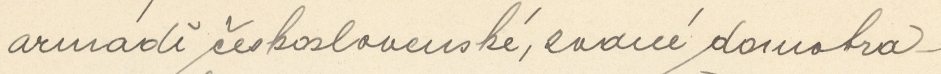armádě československé, zvané domobra-
